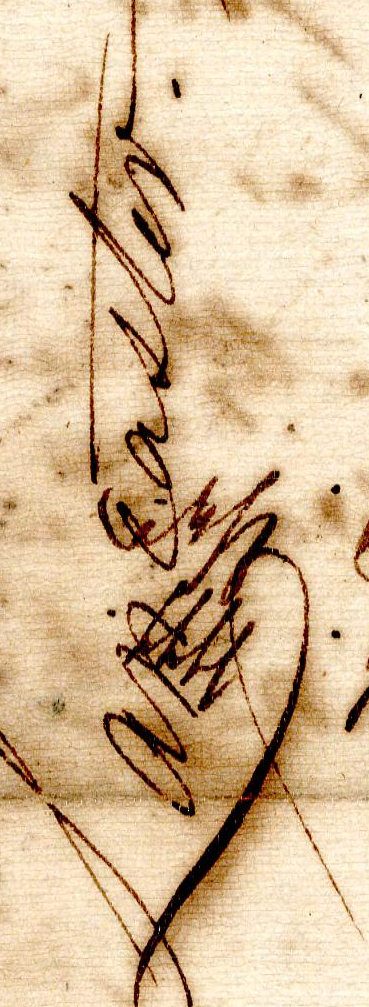Lancaster
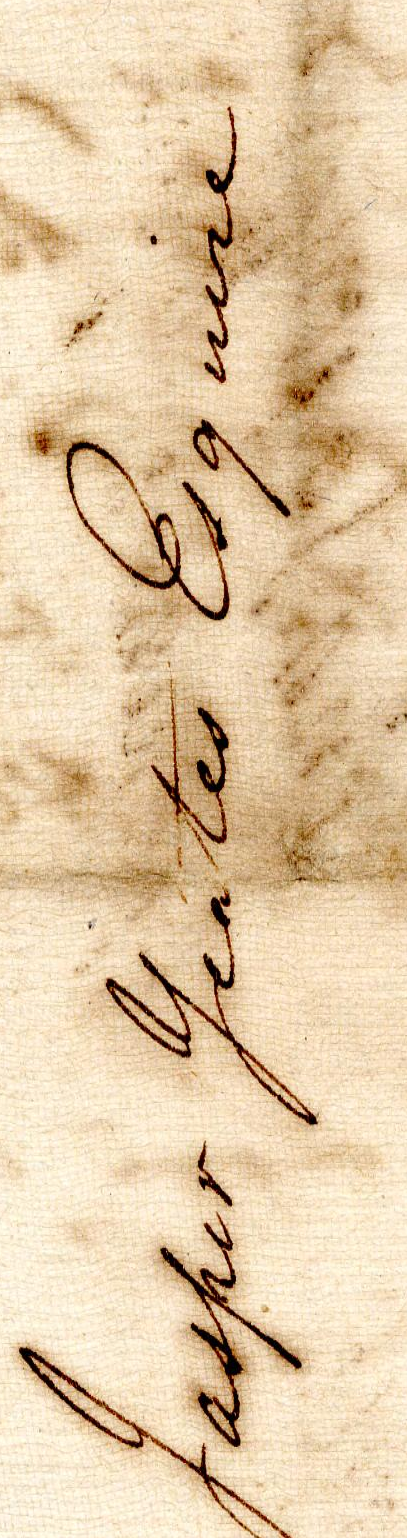Jasper Yeates Esquire
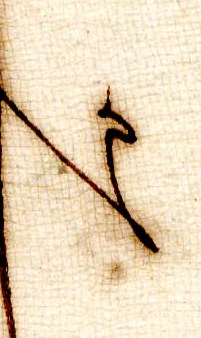To
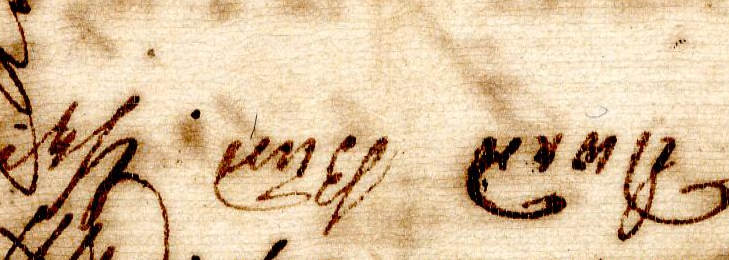Edward Burd. Esq^r.
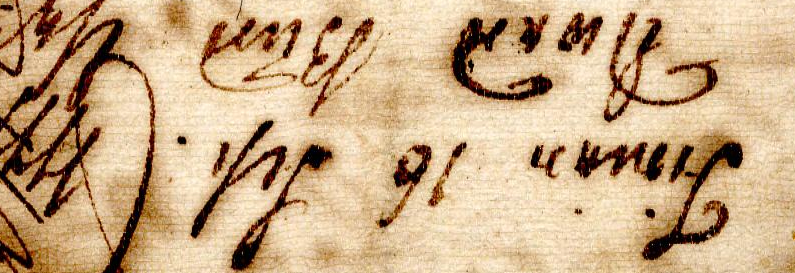Tinian 16 Sep. 1777.
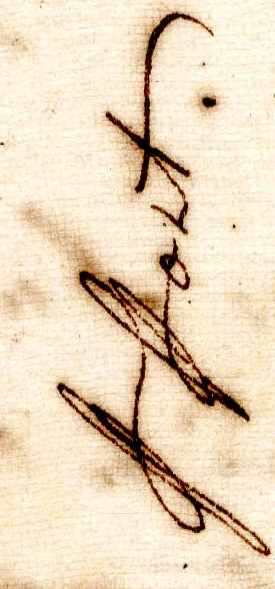Per Post.
